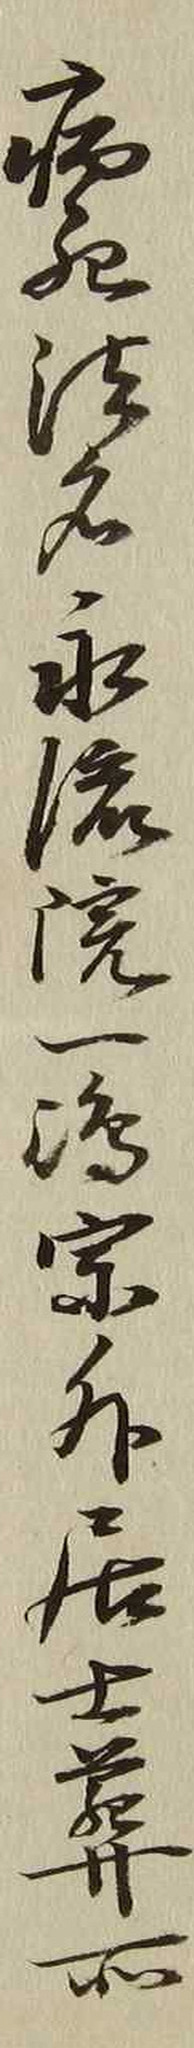病死法名永流院一嶋宗外居士葬所
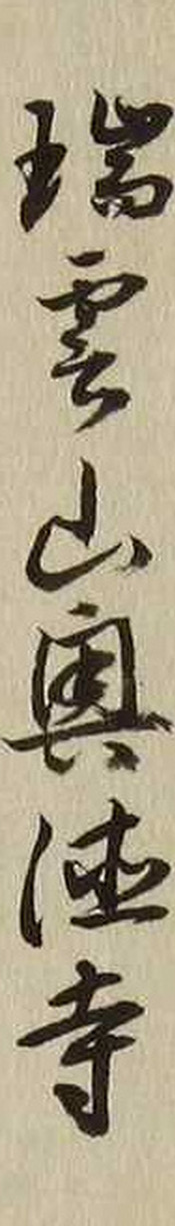瑞雲山興徳寺
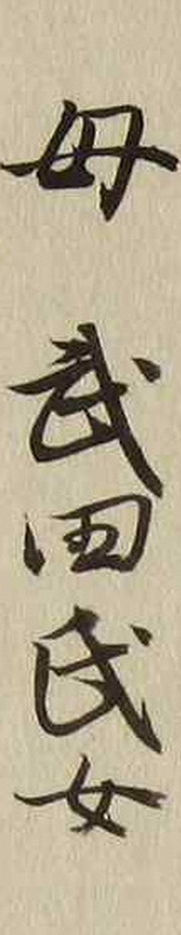母武田氏女
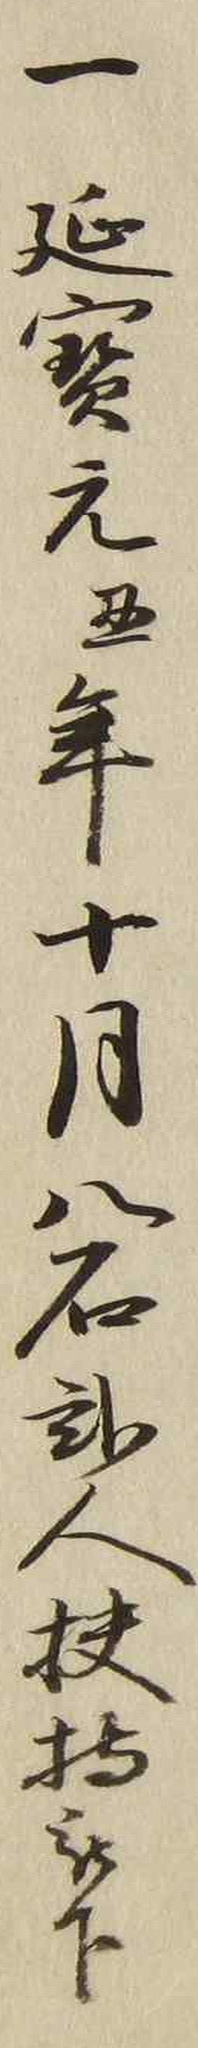一延宝元丑年十月八石弐人扶持被下

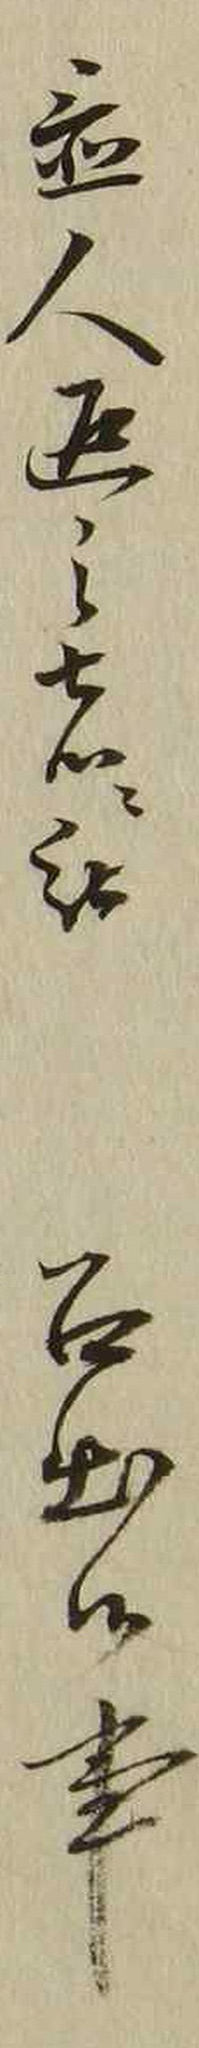置人返之者ニ被召出候事
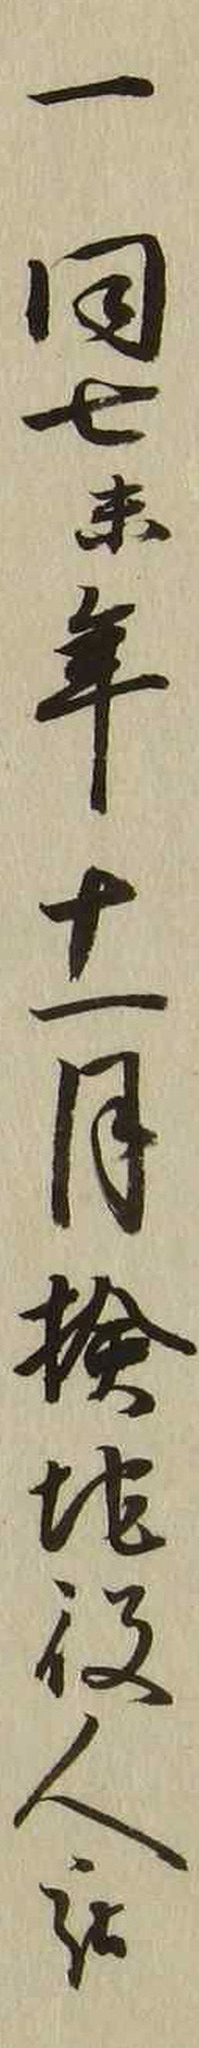一同七未年十一月検地役人被
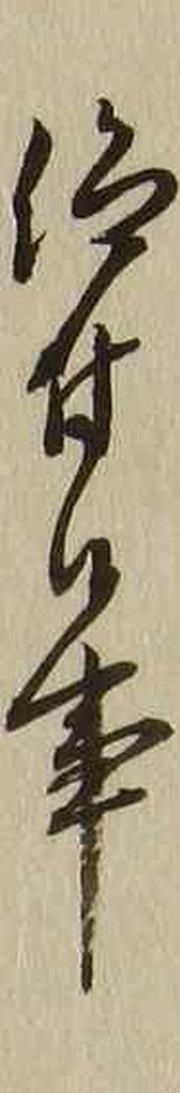仰付候事
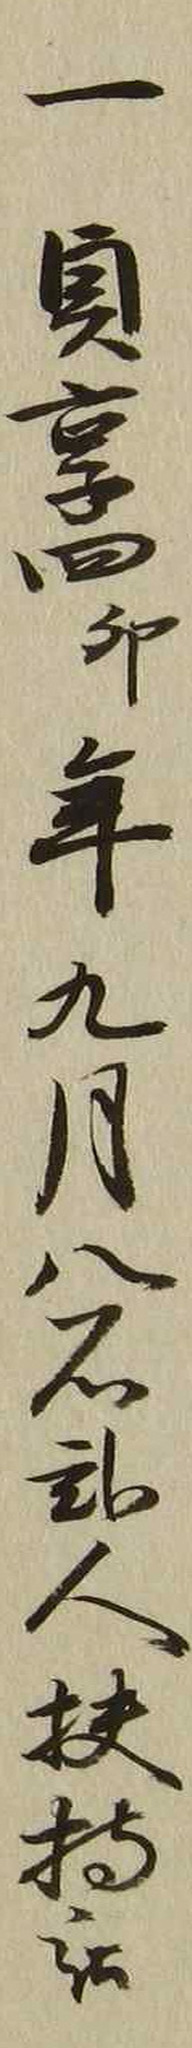一貞享四卯年九月八石弐人扶持被
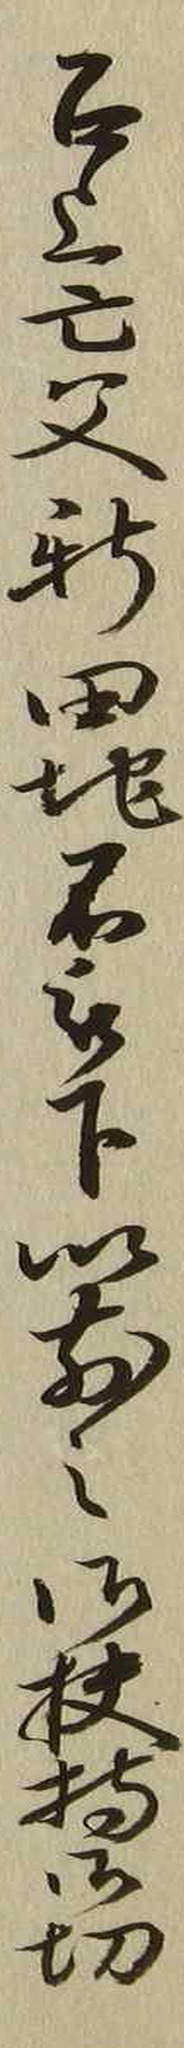召上亡父新田地不被下以前之御扶持御切
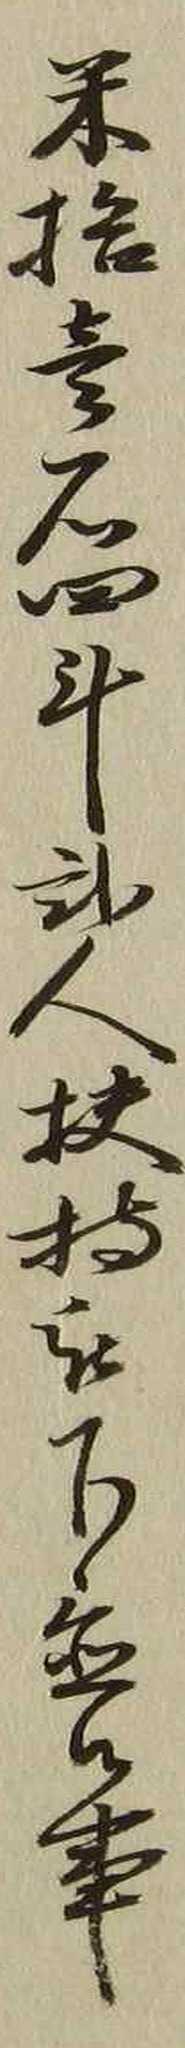米拾壱石四斗弐人扶持被下置候事
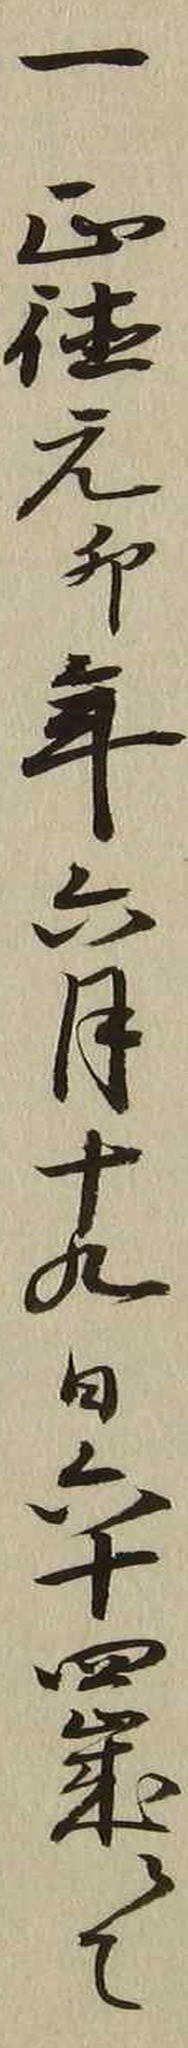一正徳元卯年六月十九日六十四歳ニて
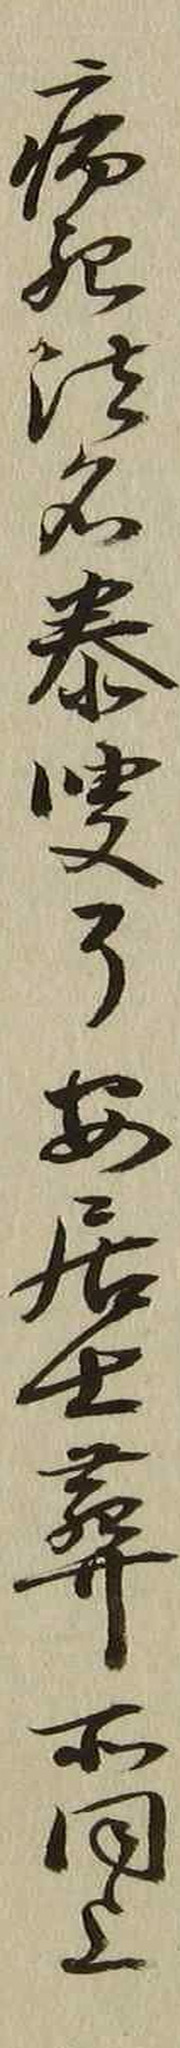病死法名泰叟了安居士葬所同上
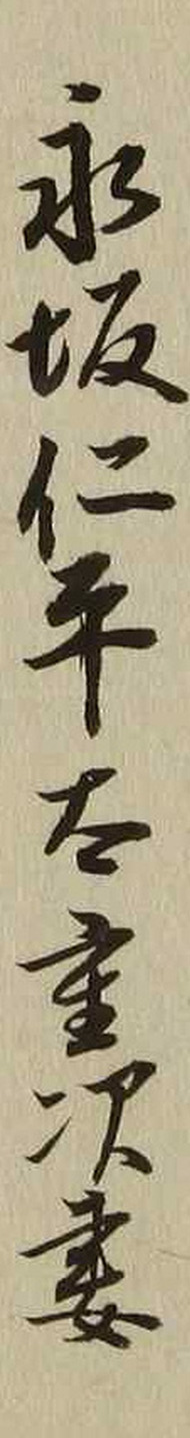女永坂仁平太重次妻
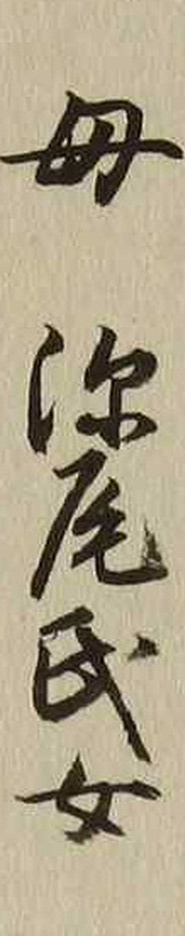母深尾氏女
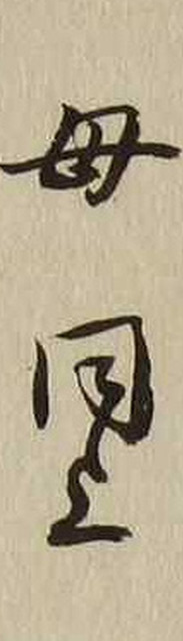母同上
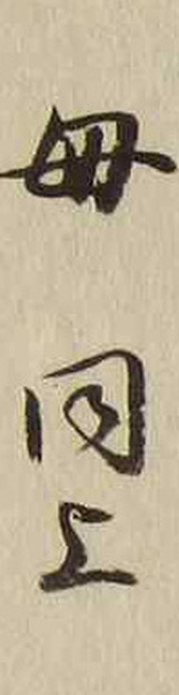母同上
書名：諸士系譜　巻之61　と之部4
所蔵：会津若松市立会津図書館
